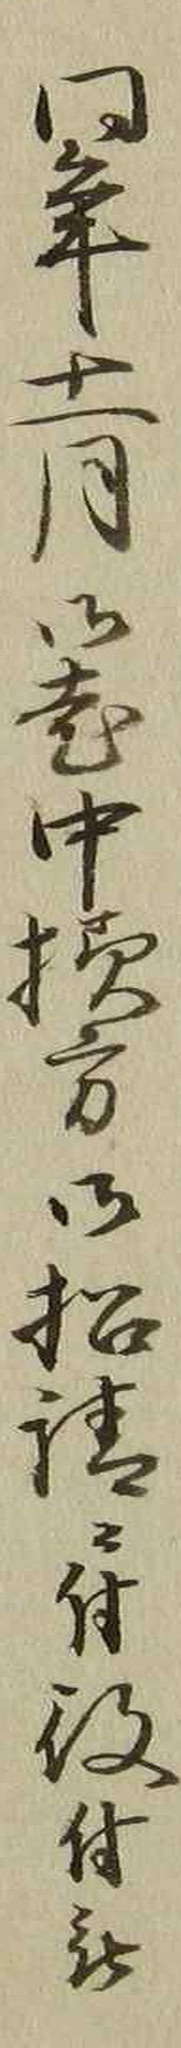一同年十二月御老中様方御招請ニ付役付被
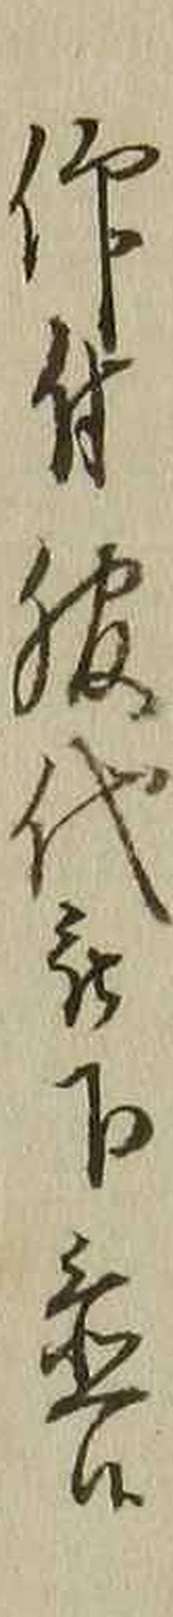仰付服代被下置候
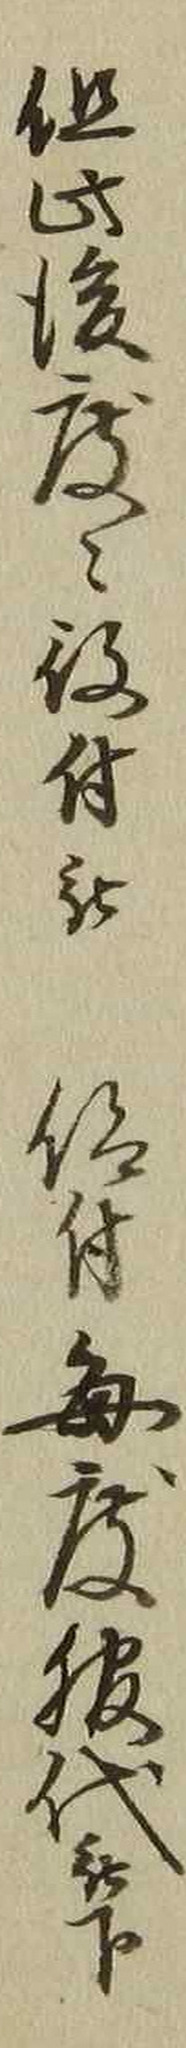但此後度々役付被仰付毎度服代被下
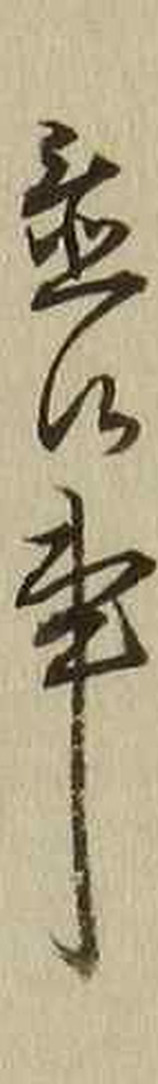置候事
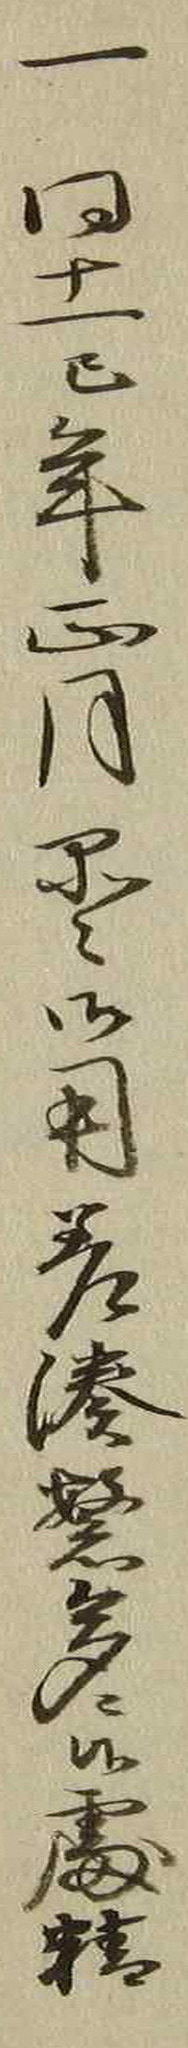一同十一巳年正月早々御用差湊繁多ニ候處精
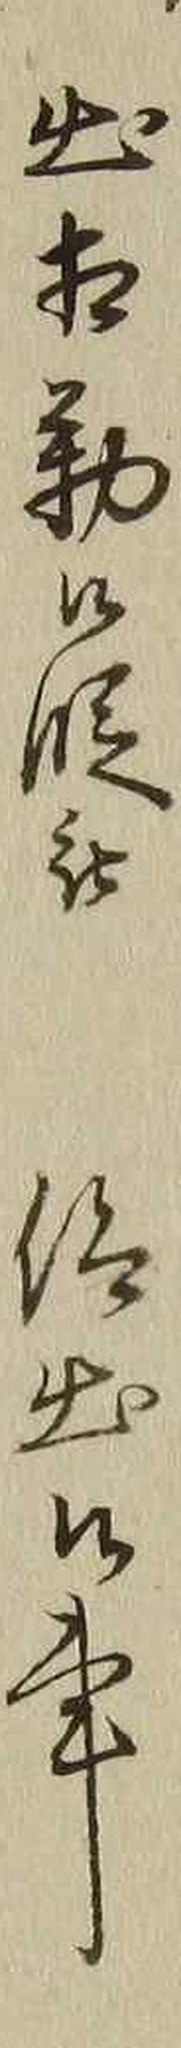出相勤候段被仰出候事
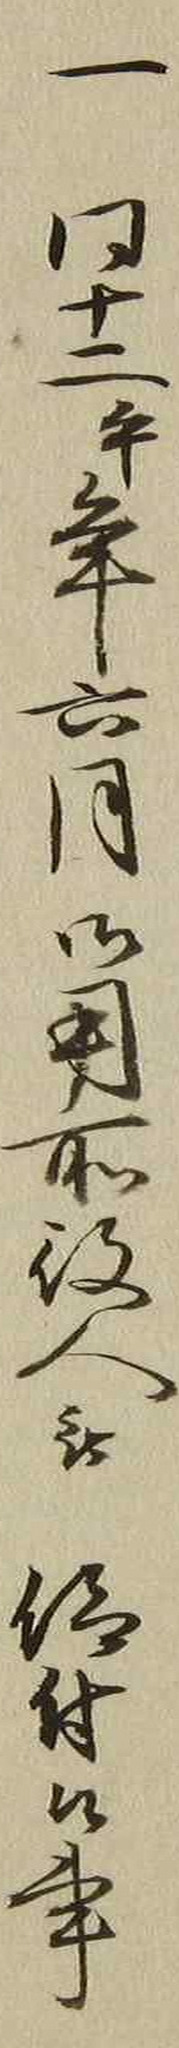一同十二午年六月御用所役人被仰付候事
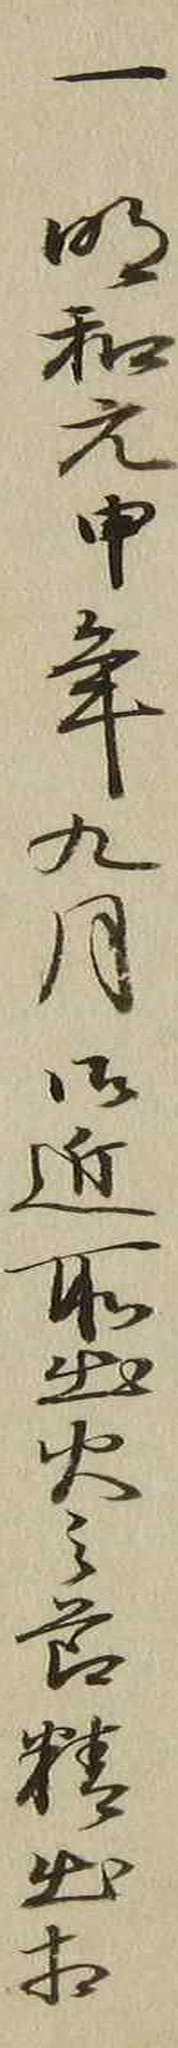一明和元申年九月御近所出火之節精出相
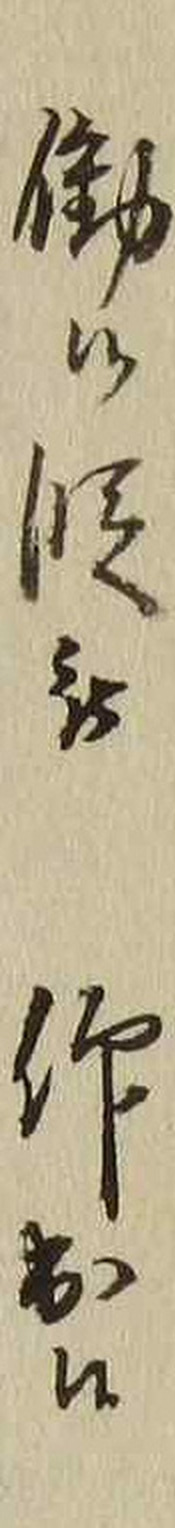働候段被仰出候
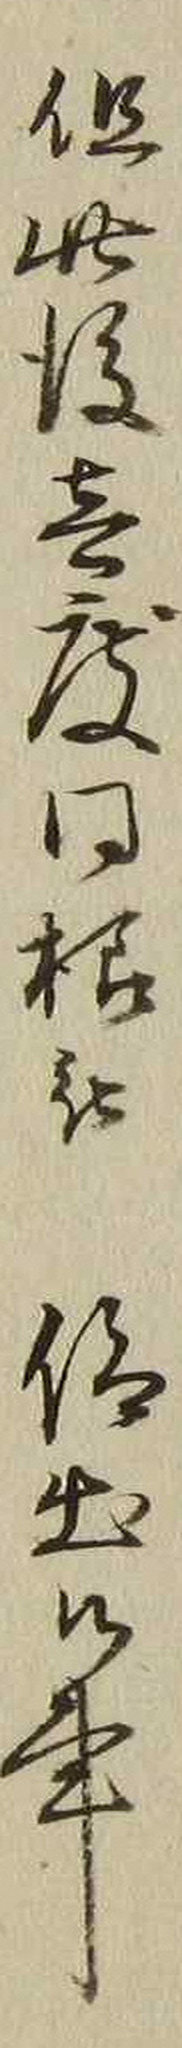但此後壱度同様被仰出候事
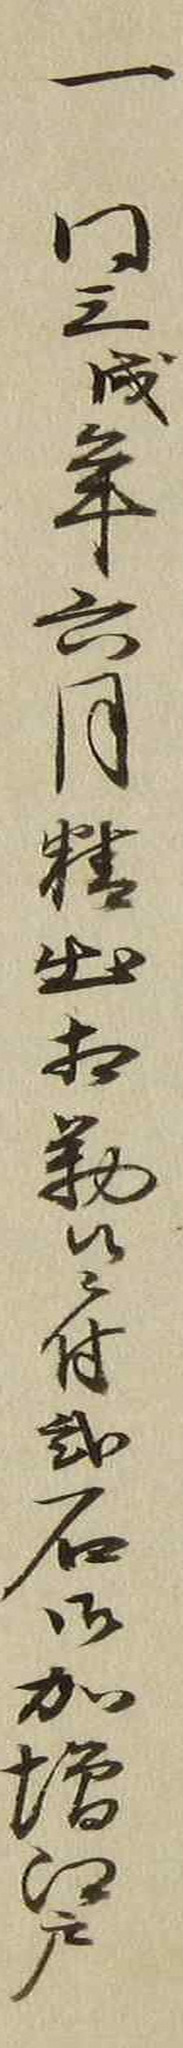一同三戌年六月精出相勤候ニ付弐石御加増江戸
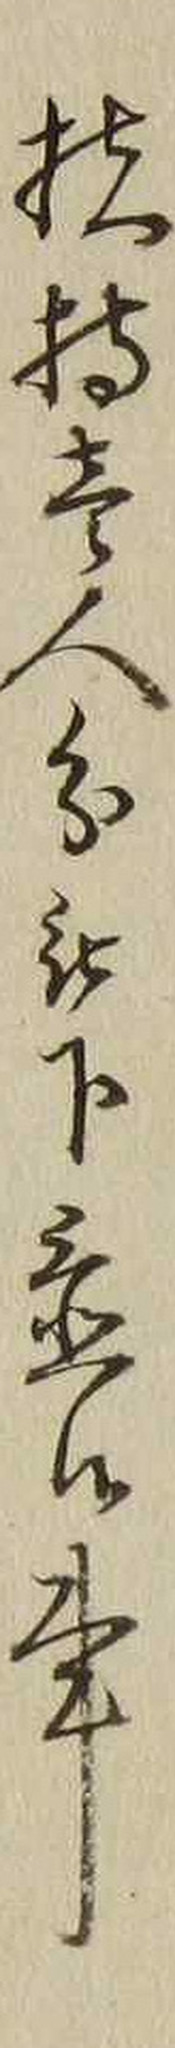扶持壱人分被下置候事
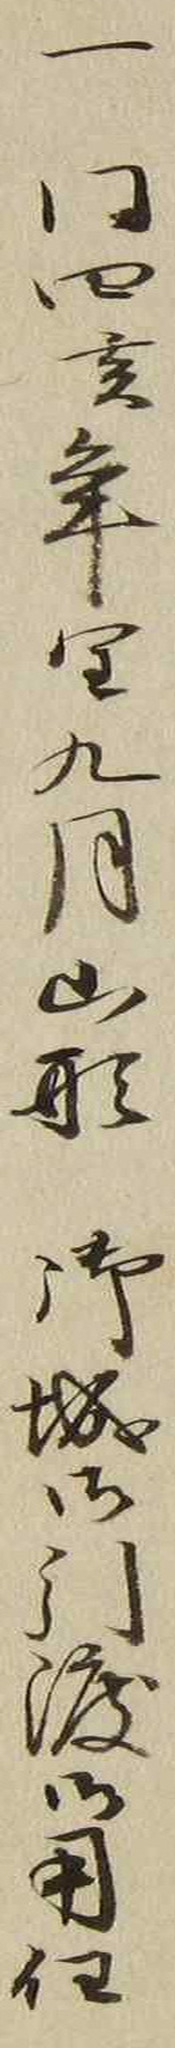一同四亥年閏九月山形御城御引渡御用伺
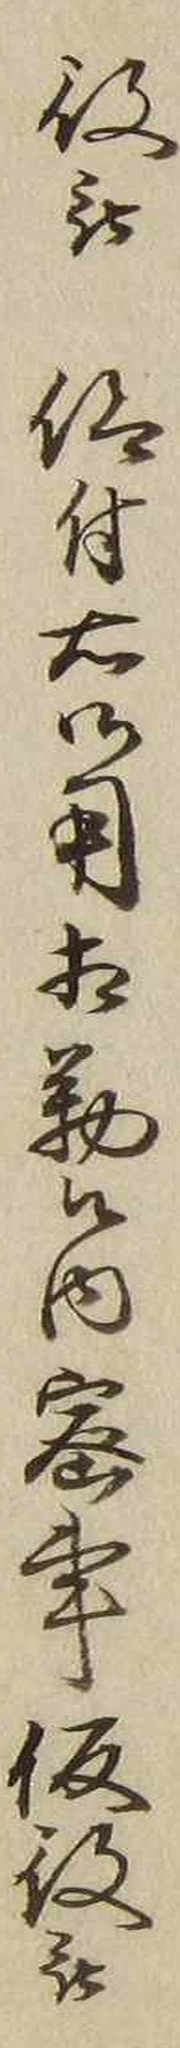役被仰付右御用相勤候内密事仮役被
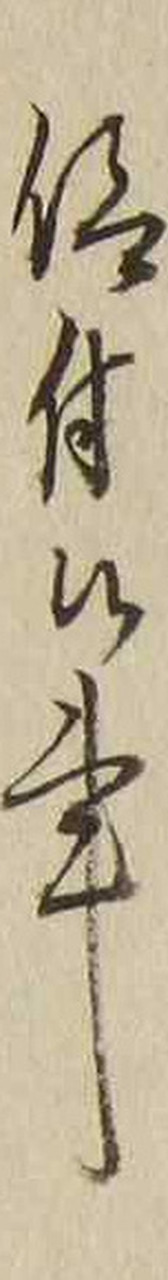仰付候事

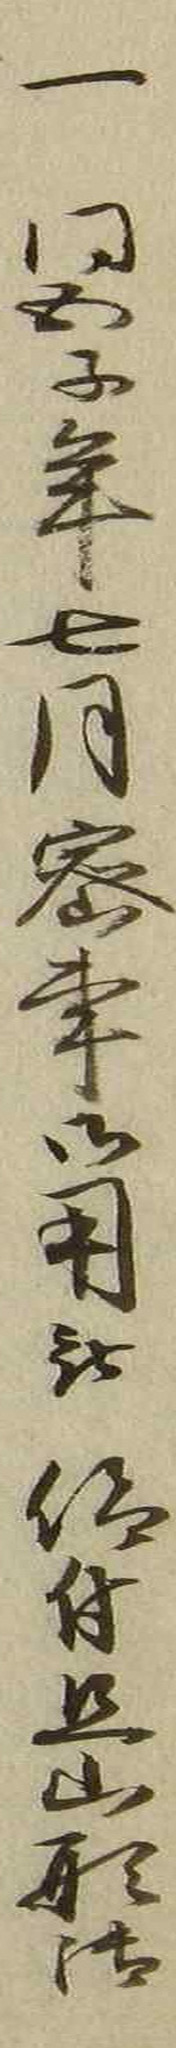一同五子年七月密事御用被仰付旦山形御
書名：諸士系譜　巻之114　か之部22
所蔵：会津若松市立会津図書館
